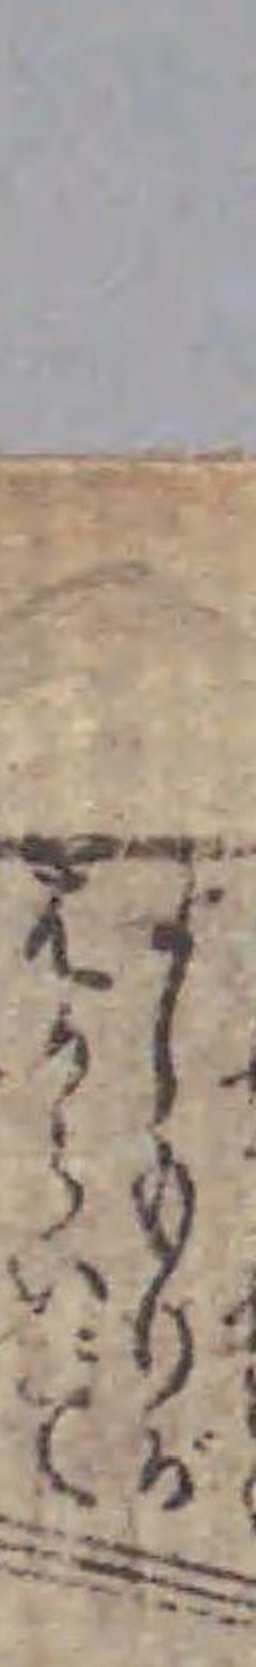はからいにて
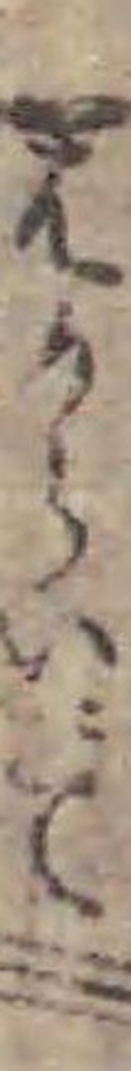はからいにて
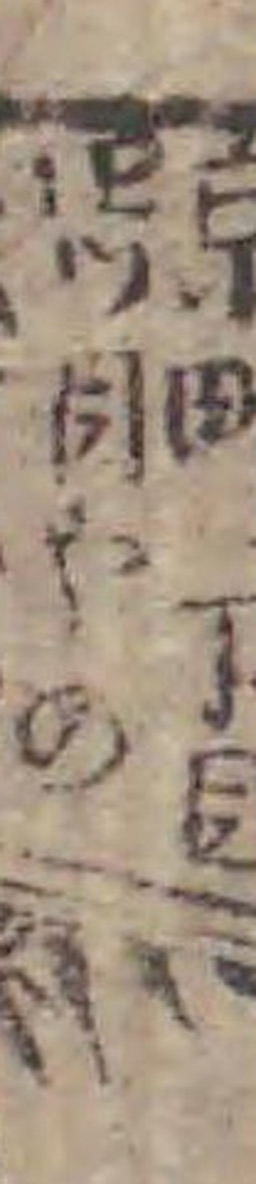四ツ目やの
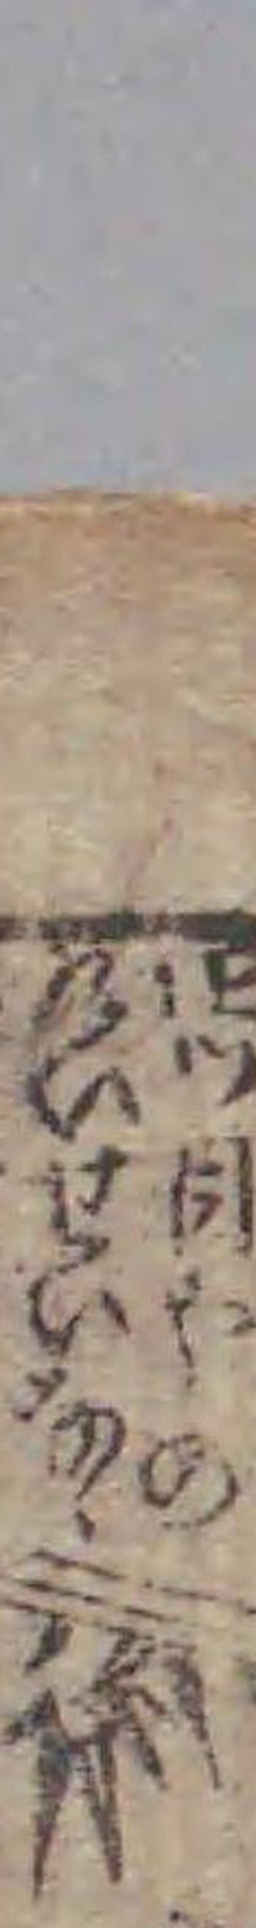けいせいなゝ
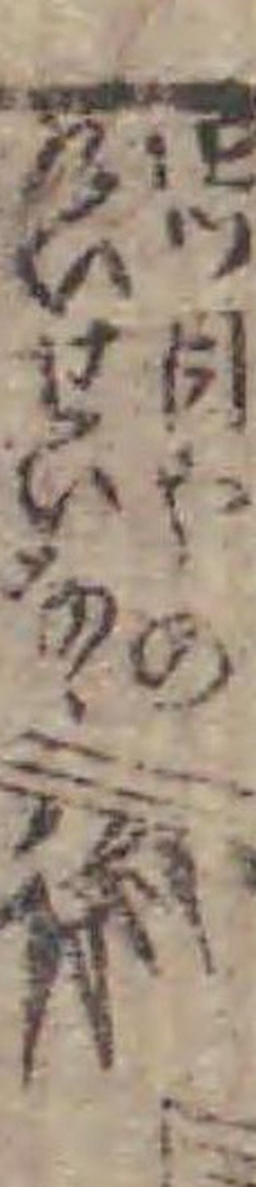けいせいなゝ
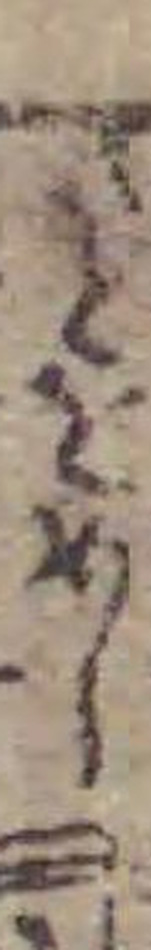さとをめし
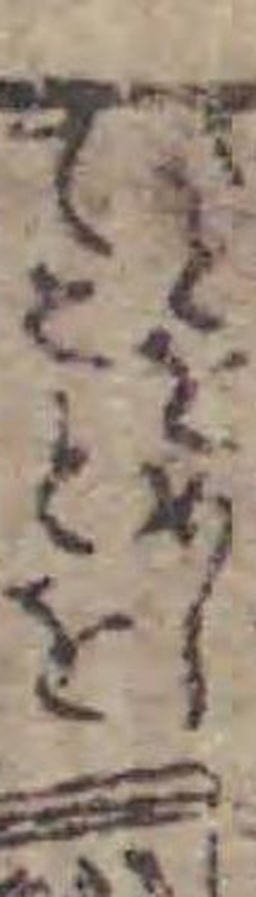てことを
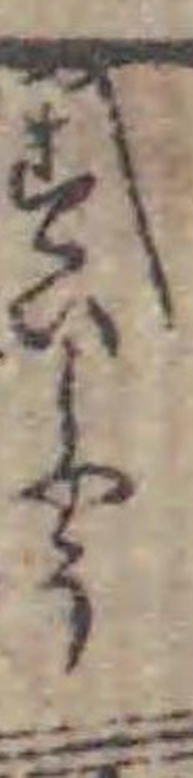〽すいしやう
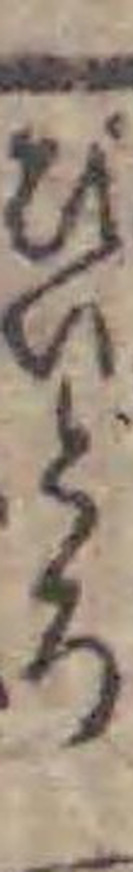びいどろ
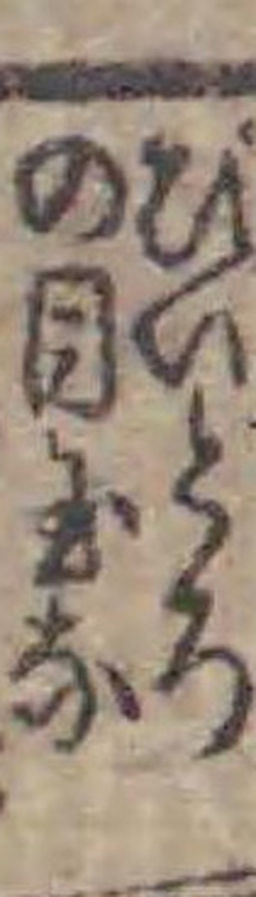の目玉な
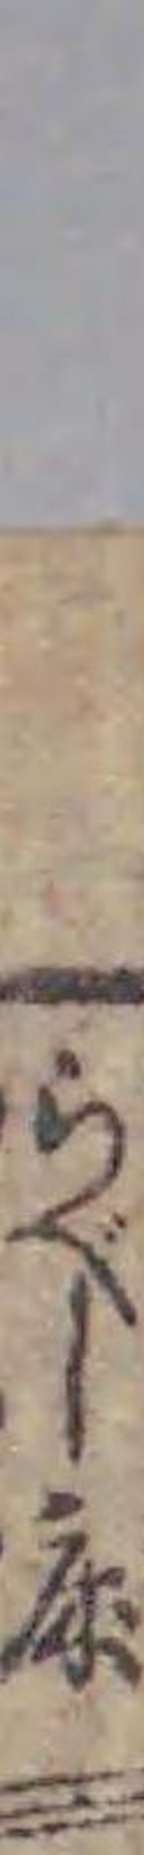らべし床
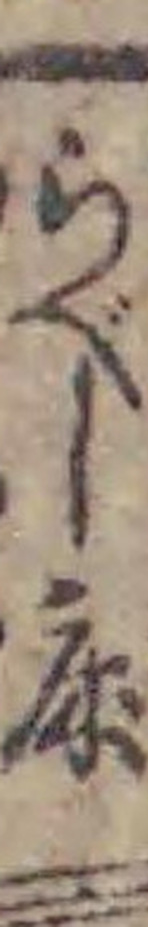らべし床
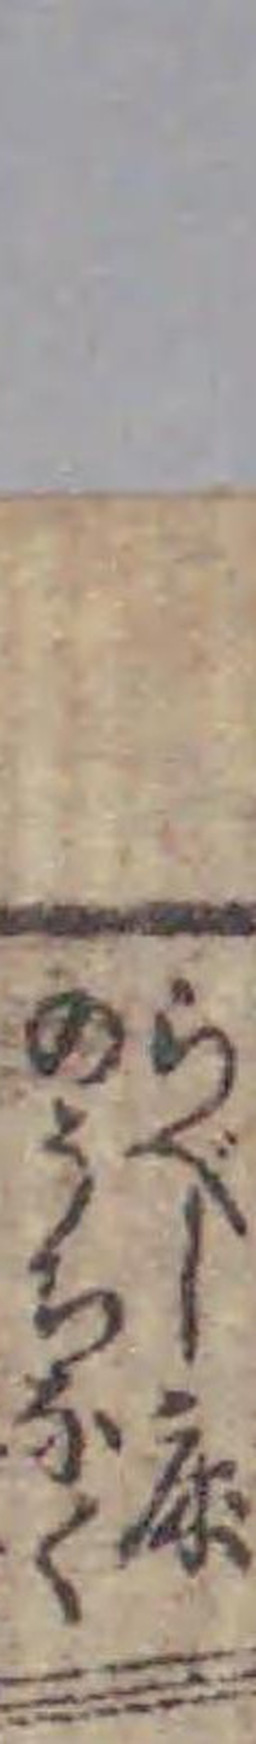のうちなく
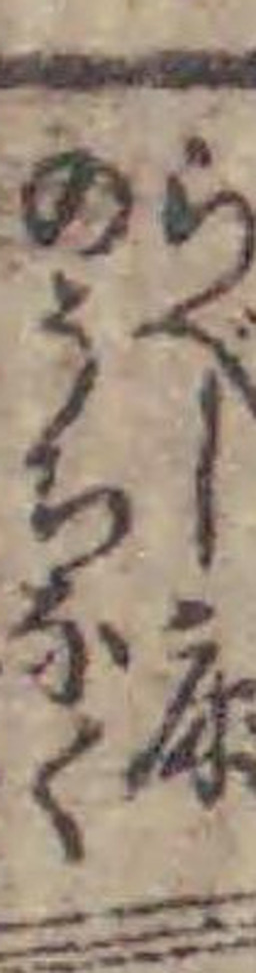のうちなく
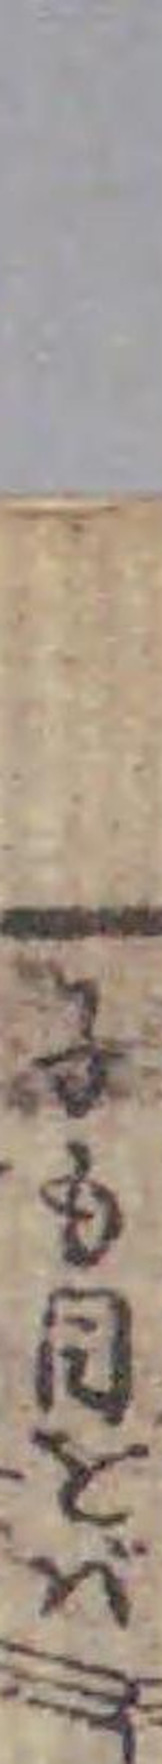子も目をば
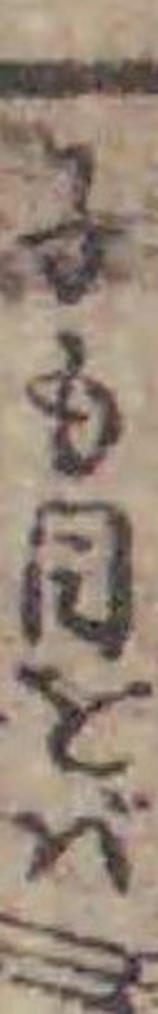子も目をば
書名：悪七変目景清 : 2巻
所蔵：国立国会図書館 National Diet Library, JAPAN
